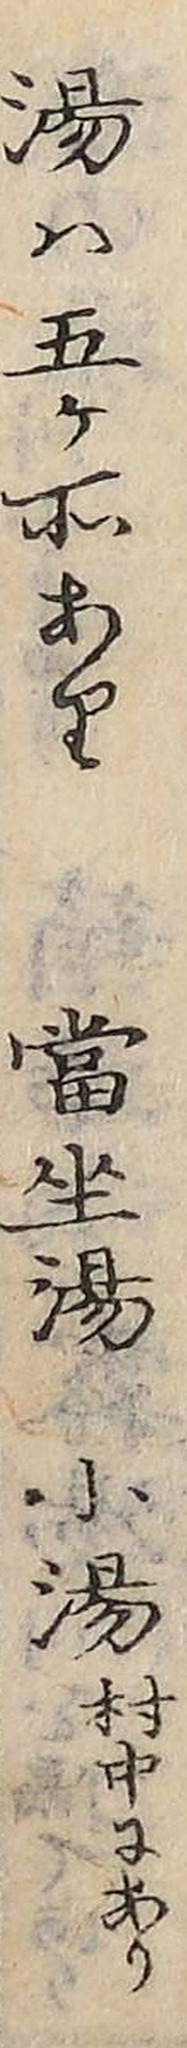湯は五ケ所あり当坐湯小湯村中にあり

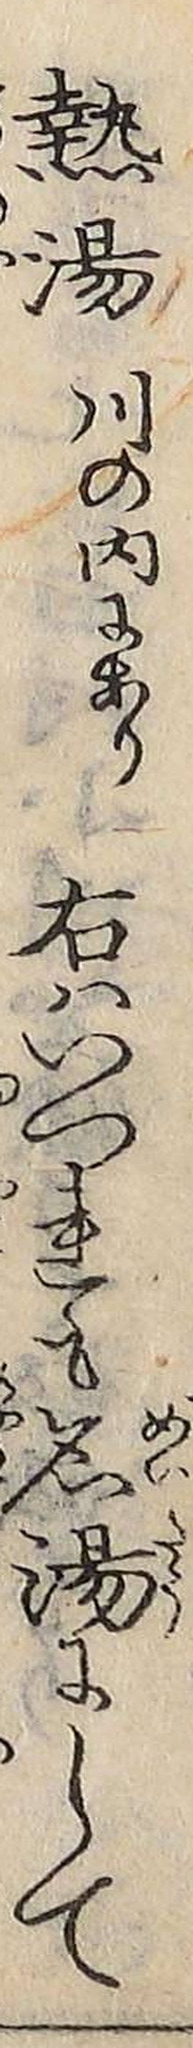熱湯川の内にあり右はいつれも名湯にして
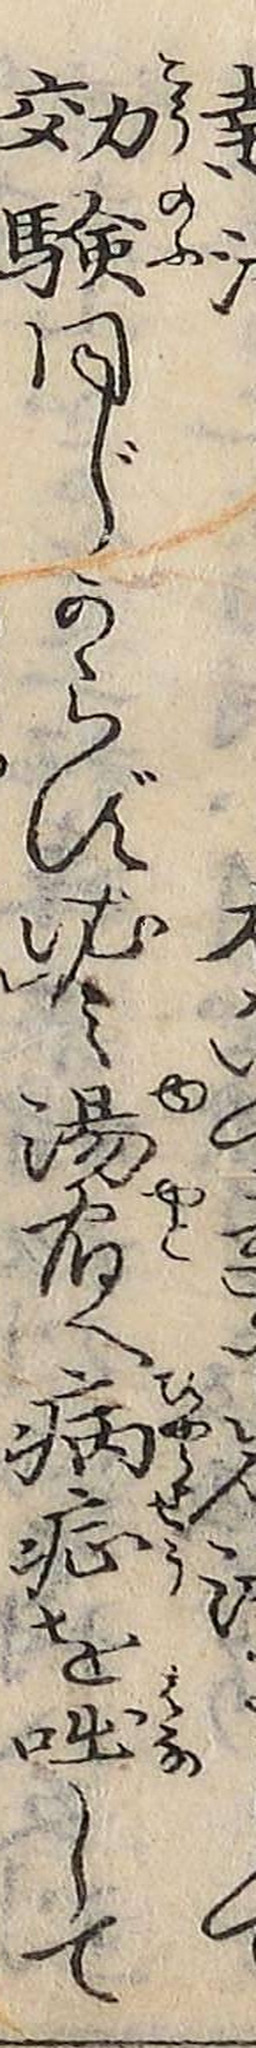効験同じからず依之湯宿へ病症を咄して
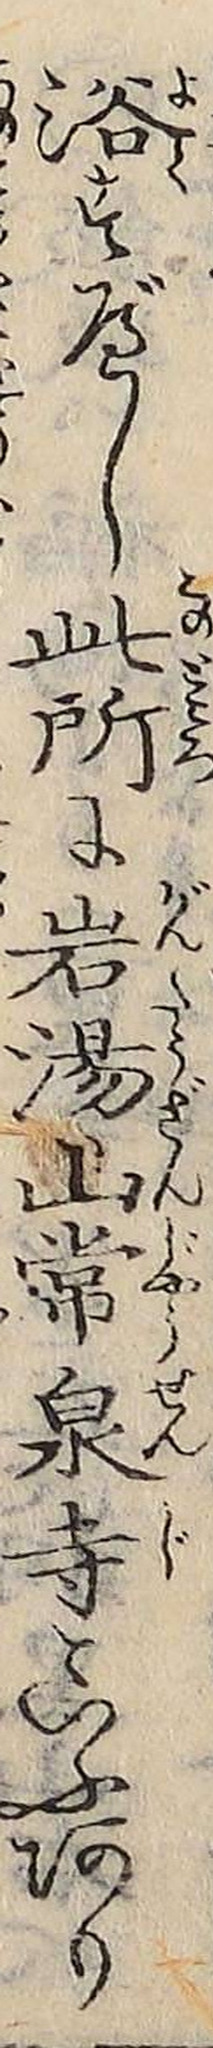浴すべし此所に岩湯山常泉寺といふあり
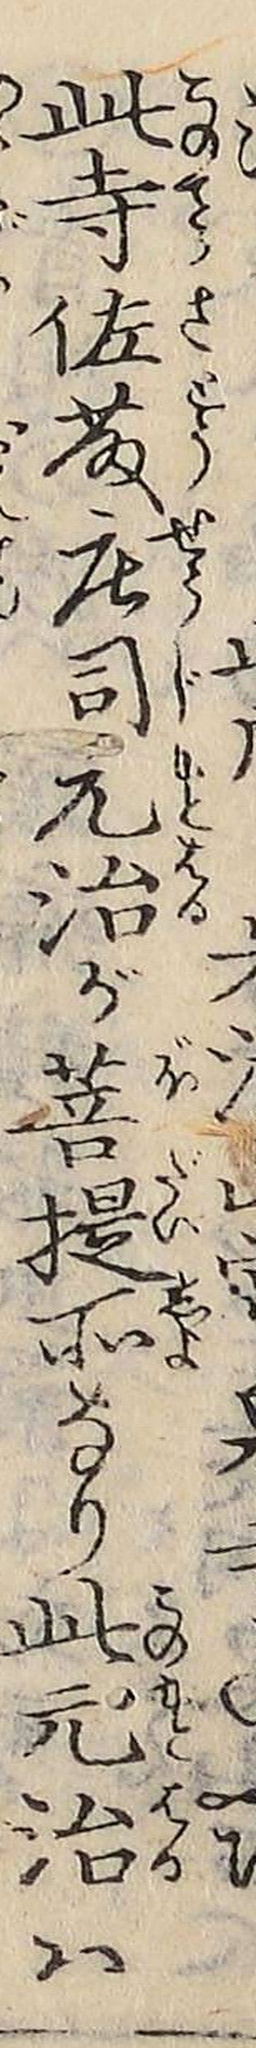此寺佐藤庄司元治が菩提所なり此元治は
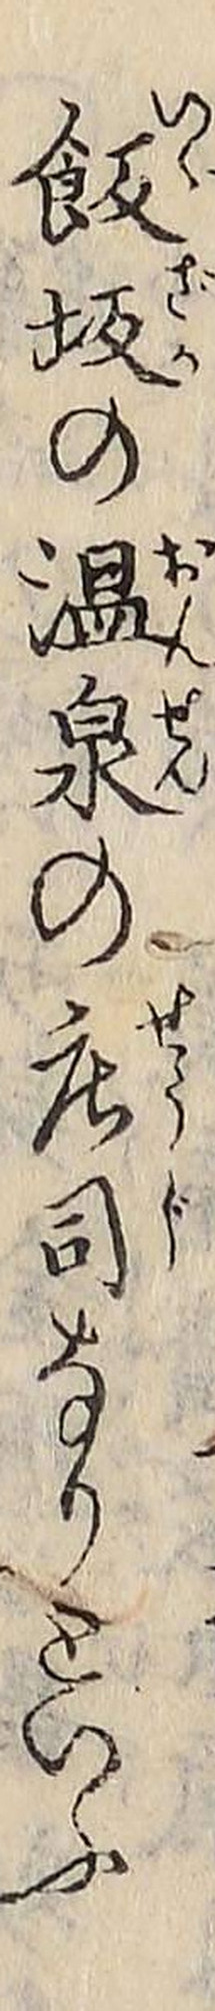飯坂の温泉の庄司なりといふ
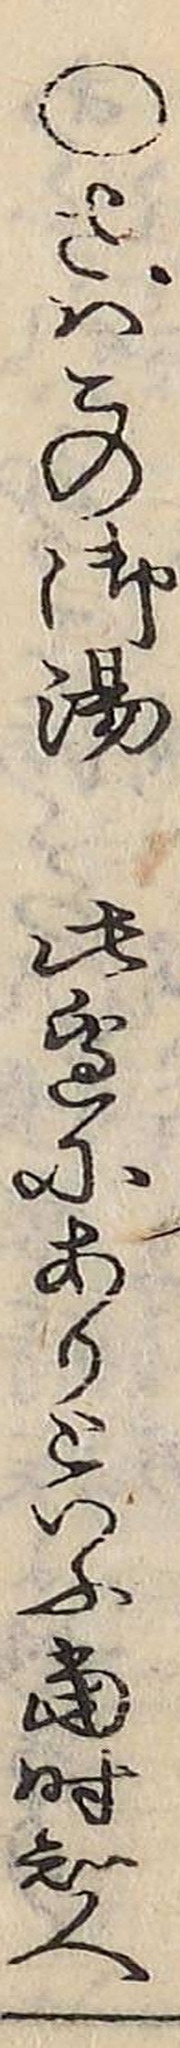〇さはこの御湯此辺にありといふ当時知人
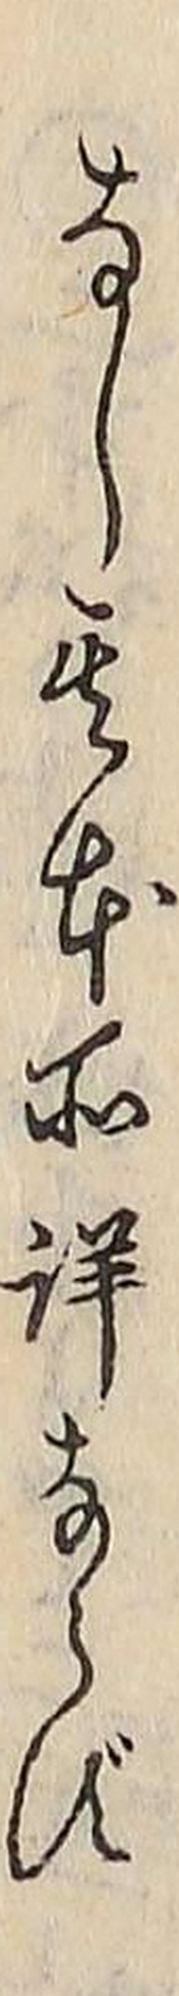なし其本所詳ならず
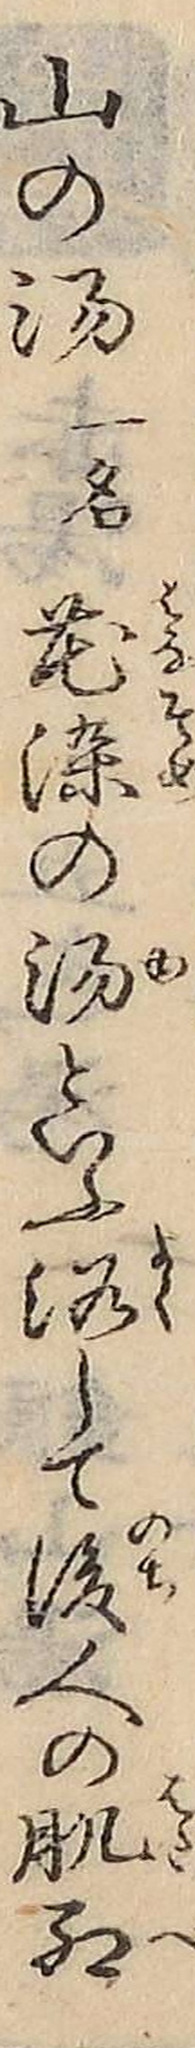山の湯一名花染の湯といふ浴して後人の肌紅

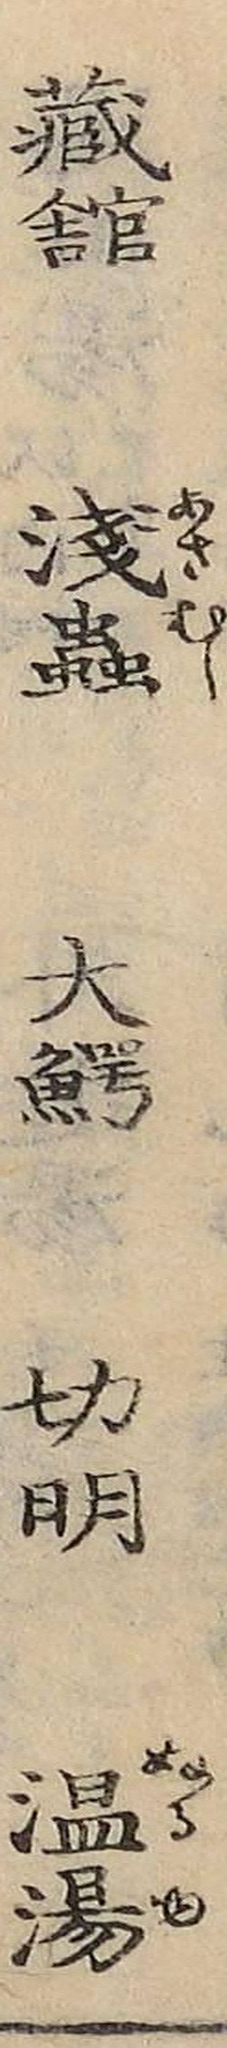蔵館浅虫大鰐切明温湯
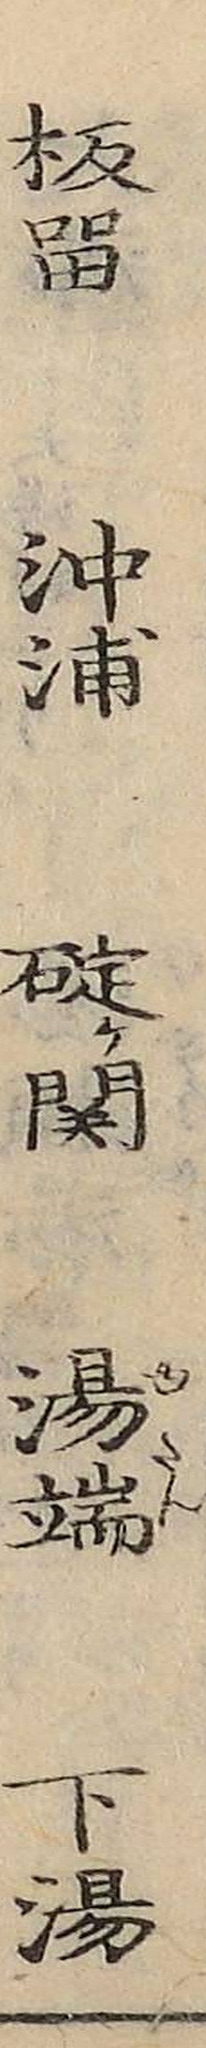板留沖浦碇ケ関湯端下湯
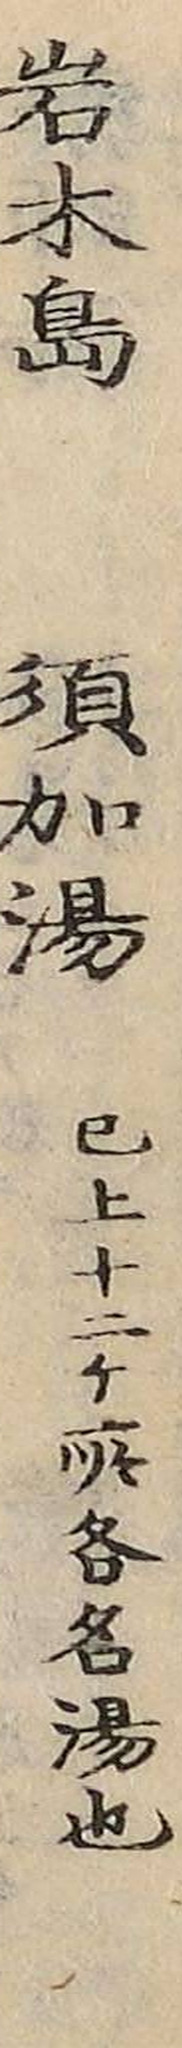岩木島須加湯巳上十二ケ所各名湯也
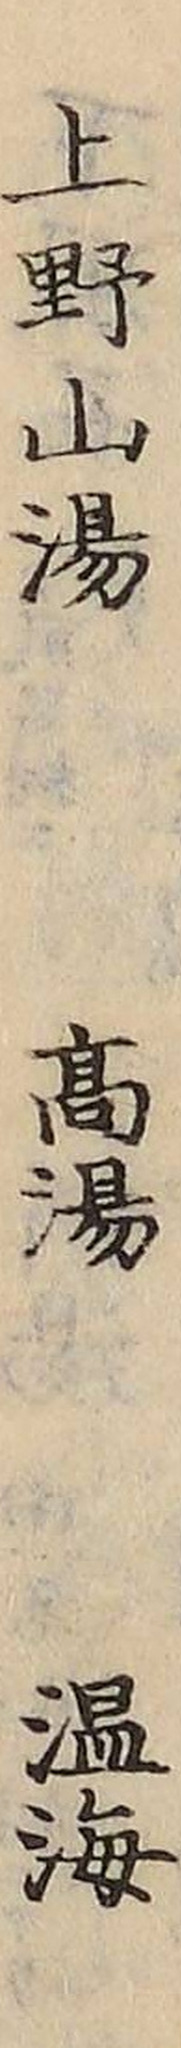上野山湯高湯温海
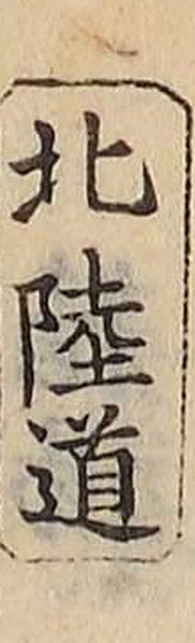北陸道
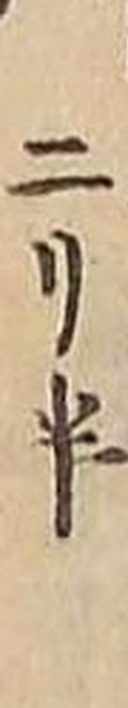二リ半
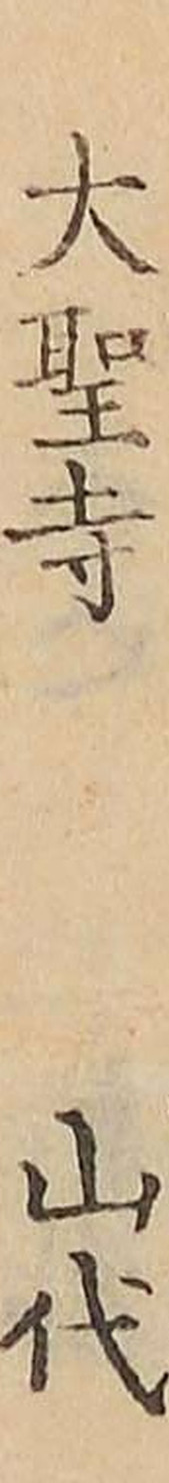大聖寺山代
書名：旅行用心集
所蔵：神戸大学附属図書館 国文学研究資料館
